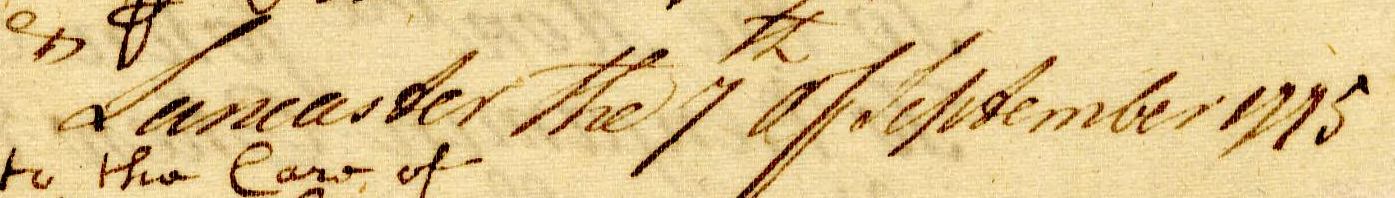Lancaster the 7^th of September 1775
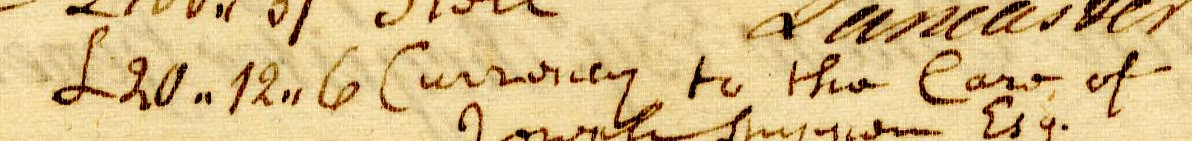£20..2..6 Currency to the Care of
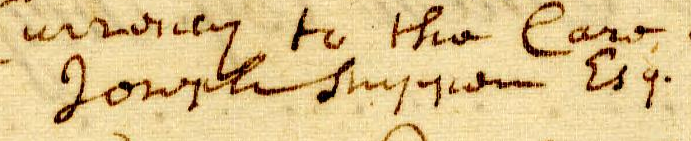Joseph Shippen Esq.
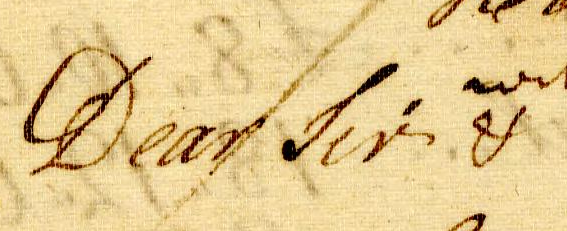Dear Sir &
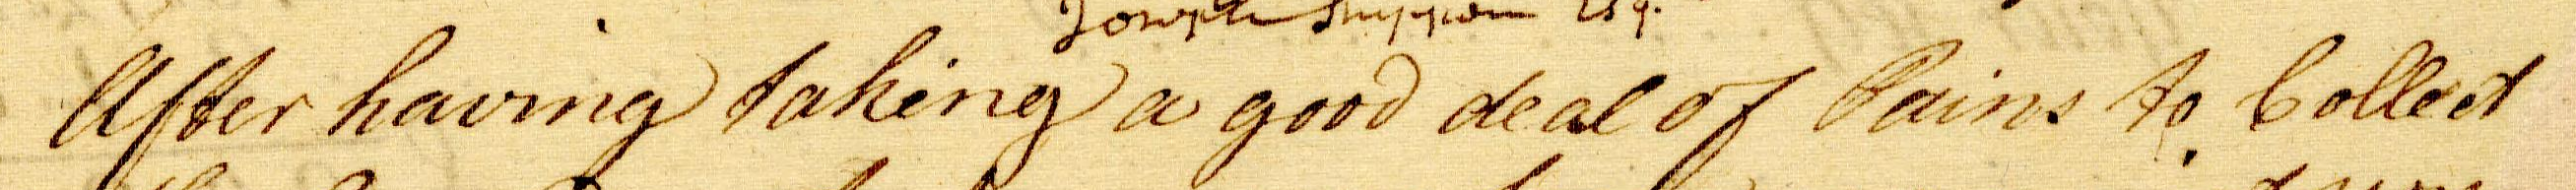After having taking a good deal of Pains to Collect
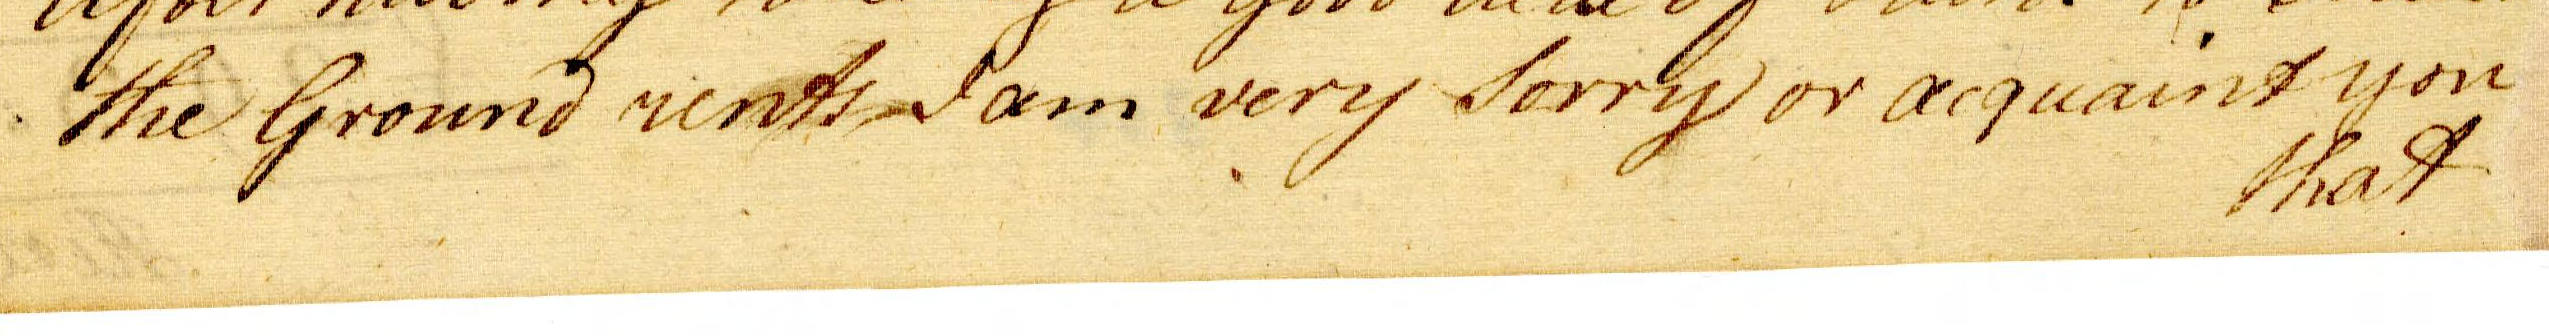the Ground rents I am very Sorry or acquaint you
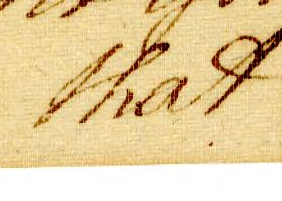that
